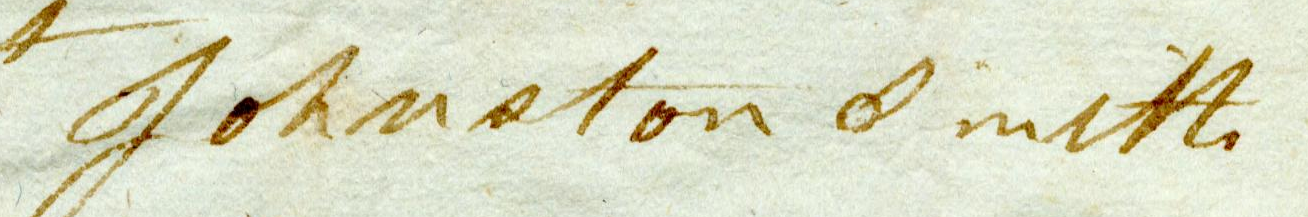Johnston Smith
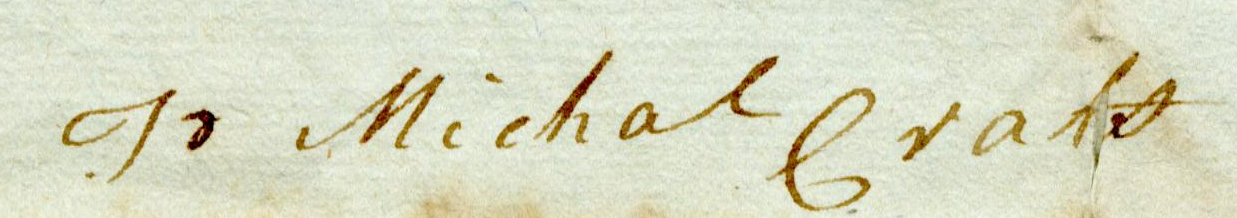To Michal Crats
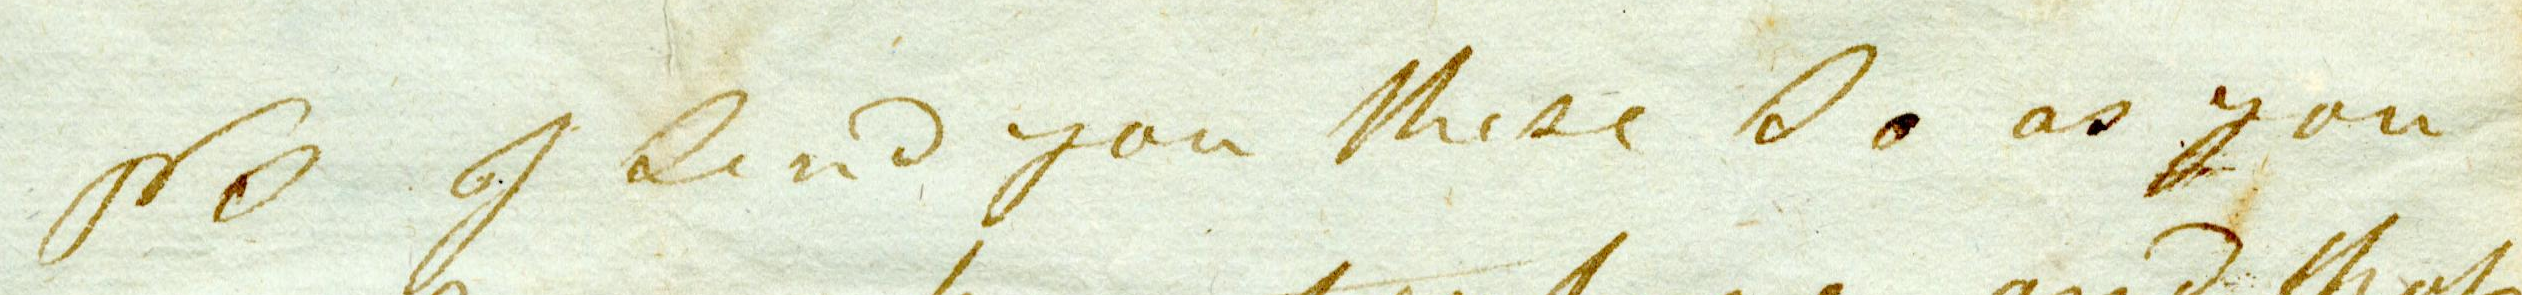PS I send you these so as you
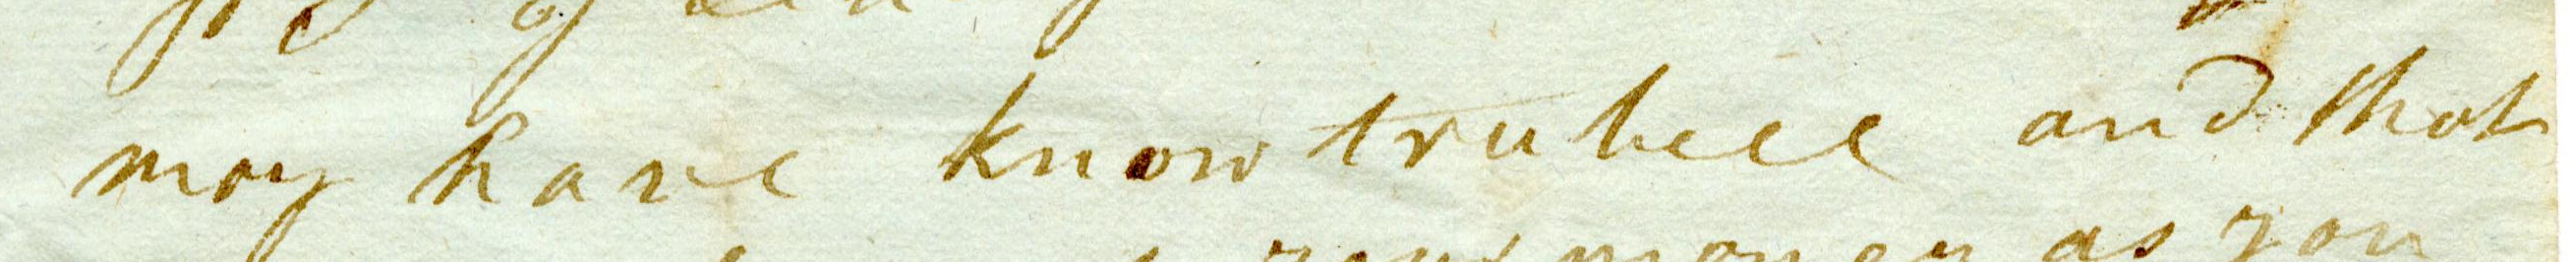may have know trubul and that
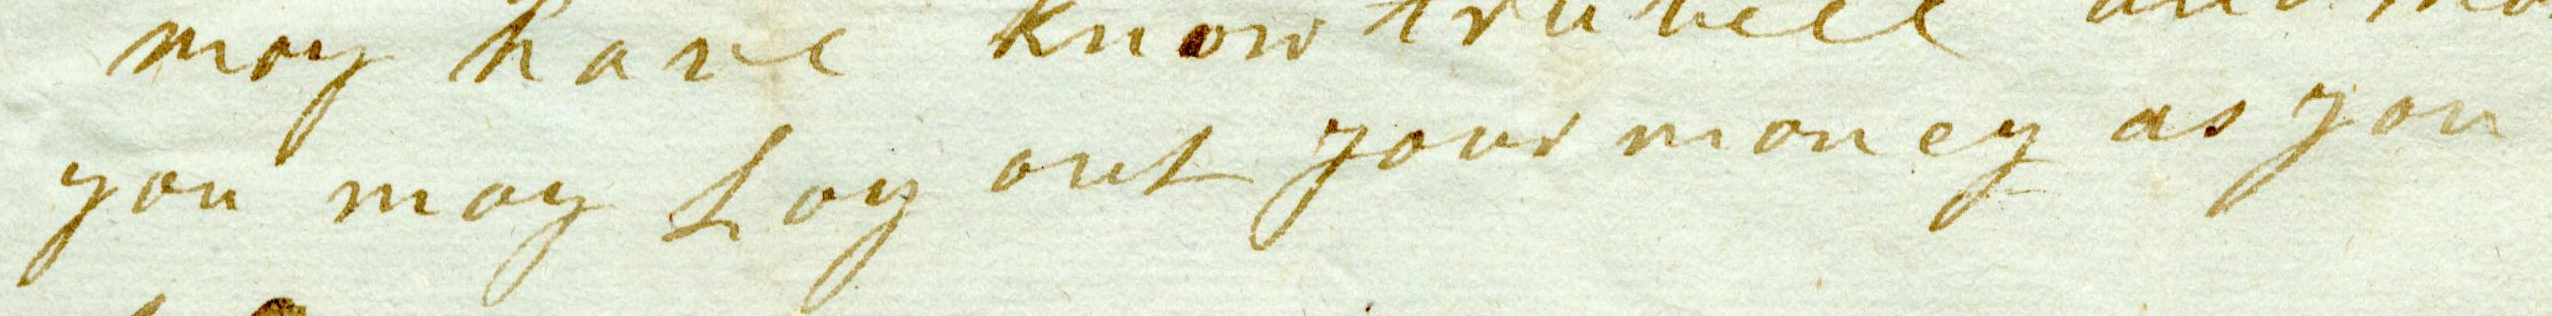you may Lay out your money as you
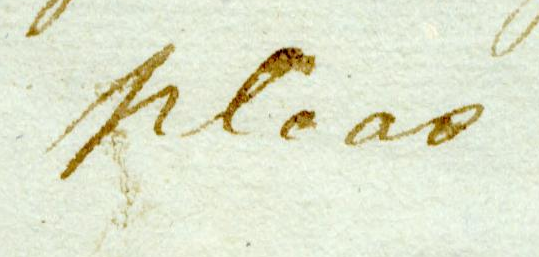pleas
